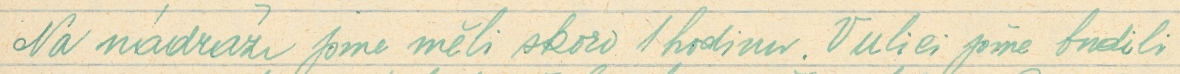Na nádraží jsme měli skoro 1 hodinu. V ulici jsme budili
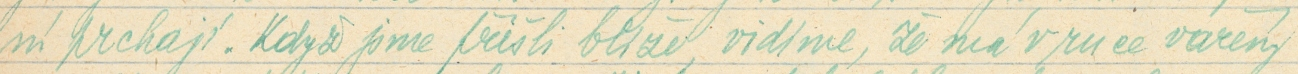ní prchají. Když jsme přišli blíže, vidíme, že má v ruce vařený
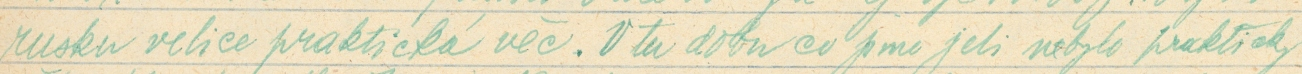rusku velice praktická věc. V tu dobu co jsme jeli nebylo prakticky
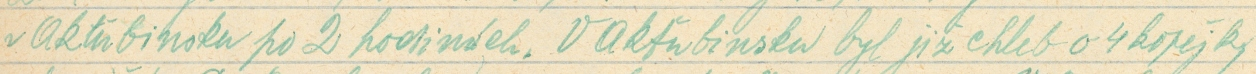v Akťubinsku po 2 hodinách. V Akťubinsku byl již chleb o 4 kopějky
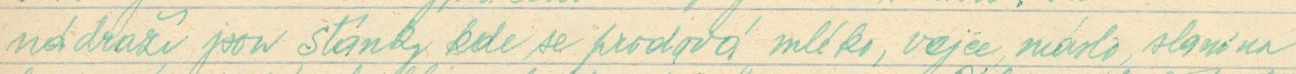nádraží jsou stánky kde se prodává mléko, vejce, máslo, slaninu
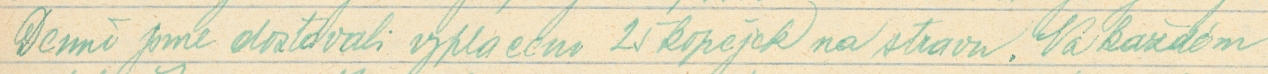Denně jsme dostavali vyplaceno 25 kopějek na stravu. Na každém
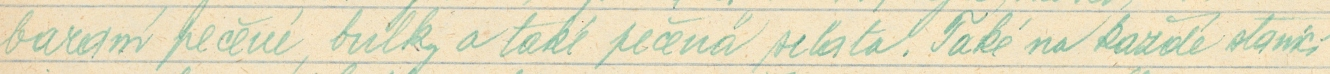baraní pečené, bulky a také pečená selata. Také na každé stanici
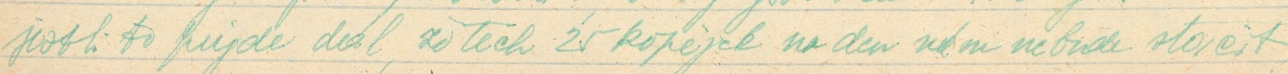jestli to půjde dál, že těch 25 kopějek na den nám nebude stačit.
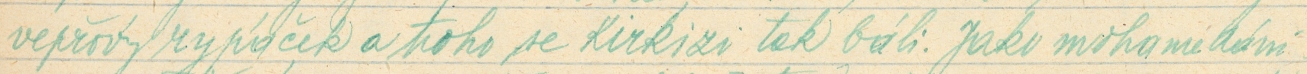vepřový rypáček a toho se Kirkizi tak báli. Jako mohamedáni
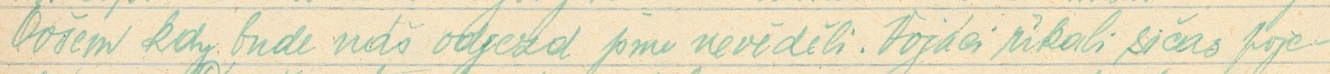Ovšem kdy bude náš odjezd jsme nevěděli. Vojáci říkali sičas poje-
